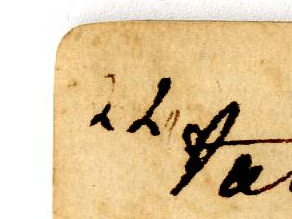22
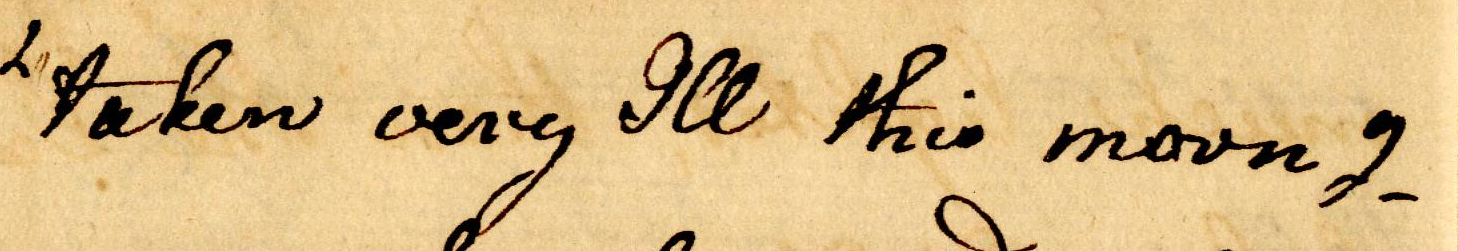taken very Ill this morn^g
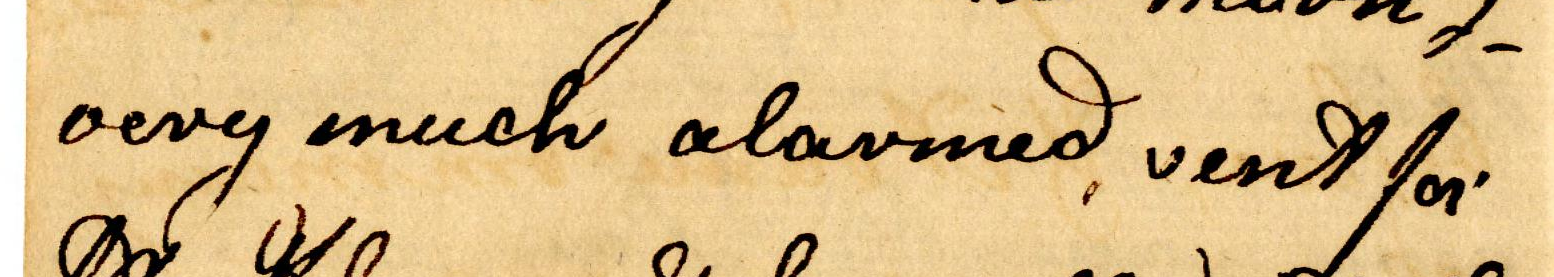very much alarmed, sent for
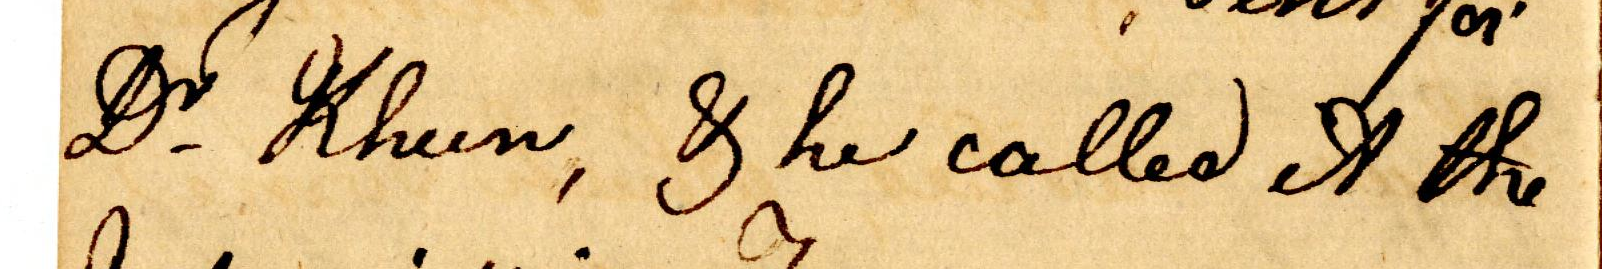D^r. Khun, & he called it the
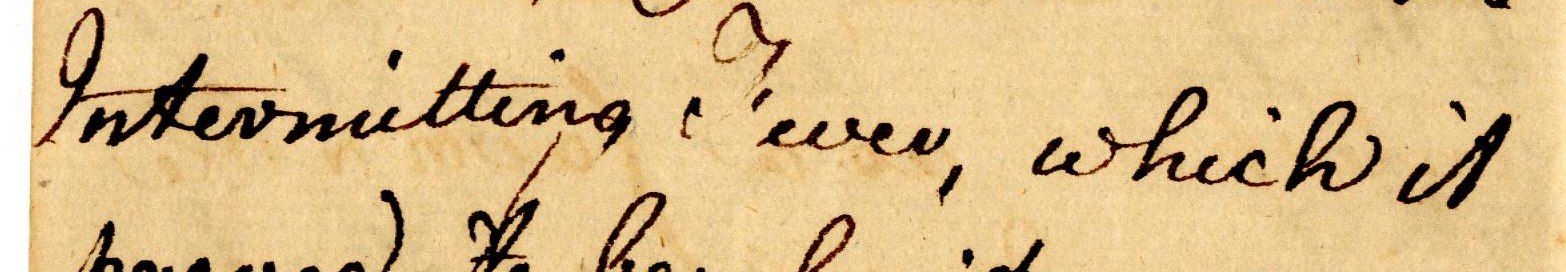Intermitting Fever, which it
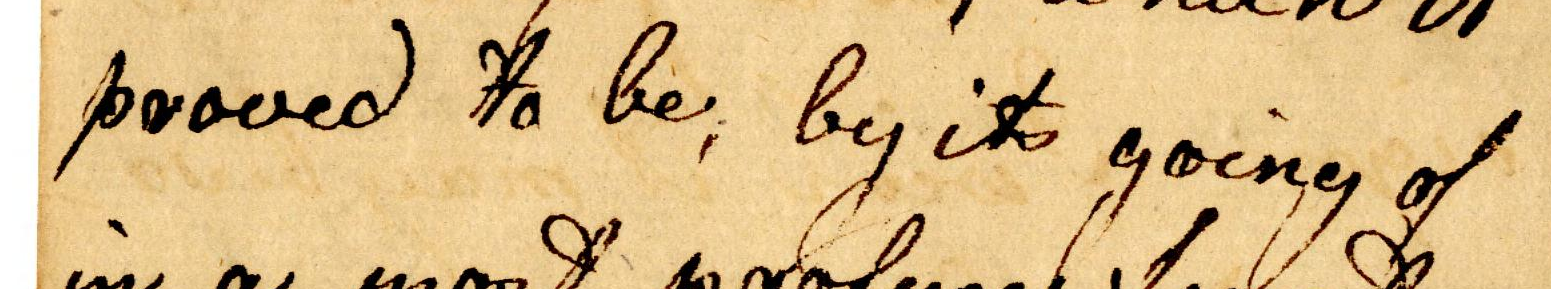proved to be, by its going of
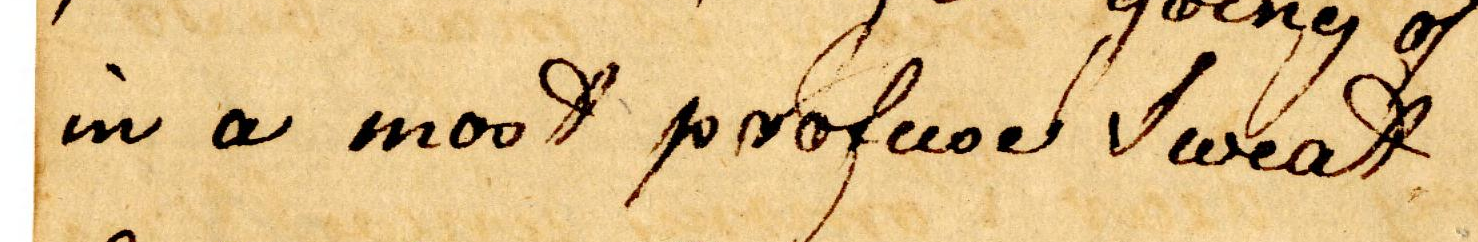in a most profuse Sweat
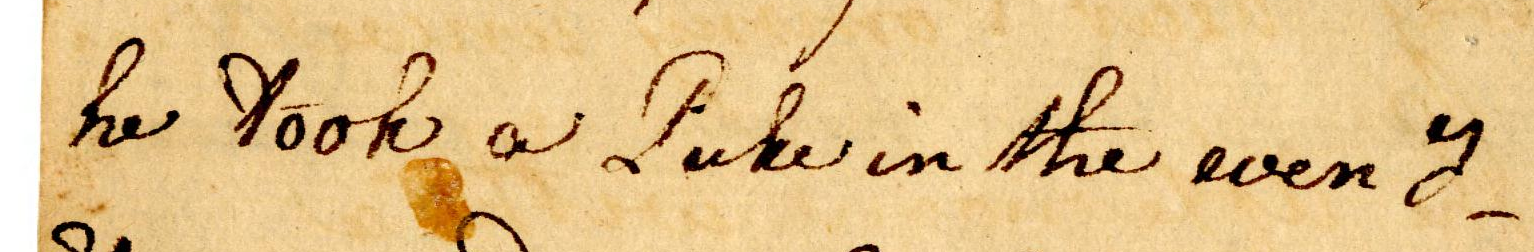he took a Puke in the even^g
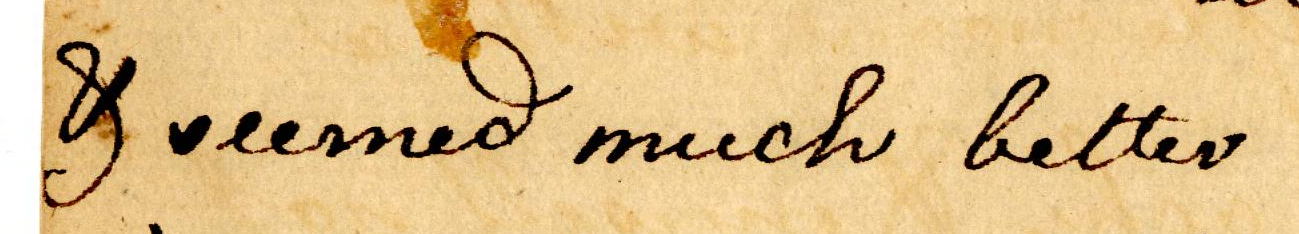& seemed much better
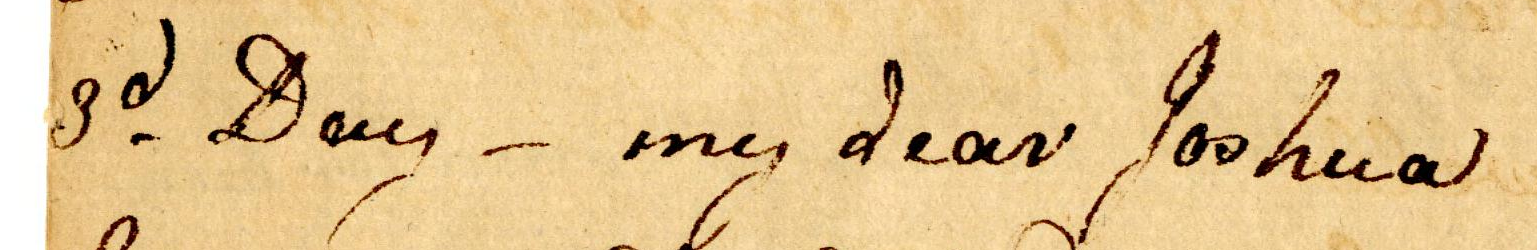3^d. Day- my dear Joshua
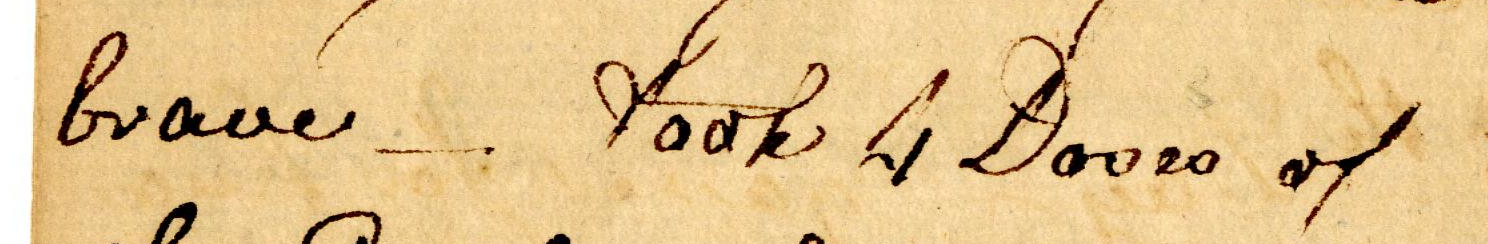brave- took 4 Doses of
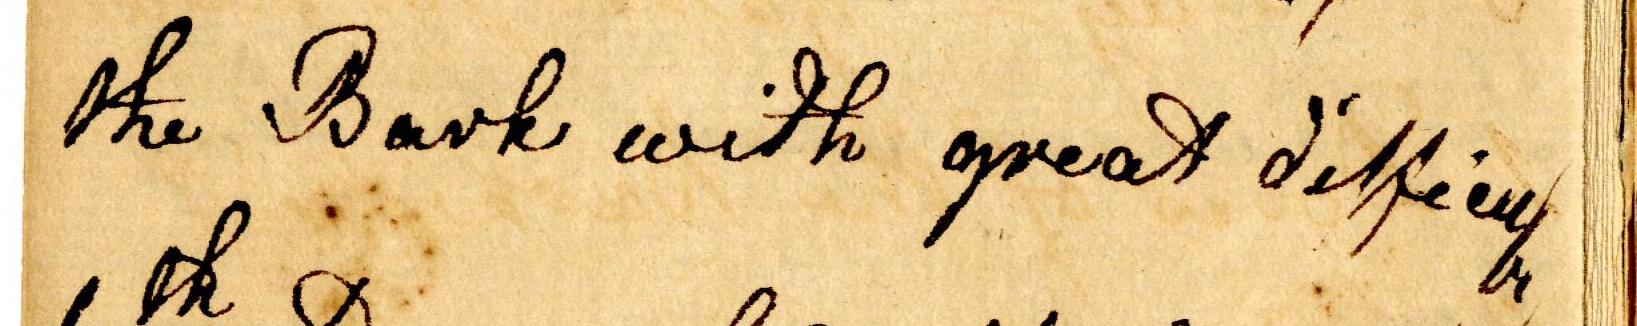the Bark with great difficuly
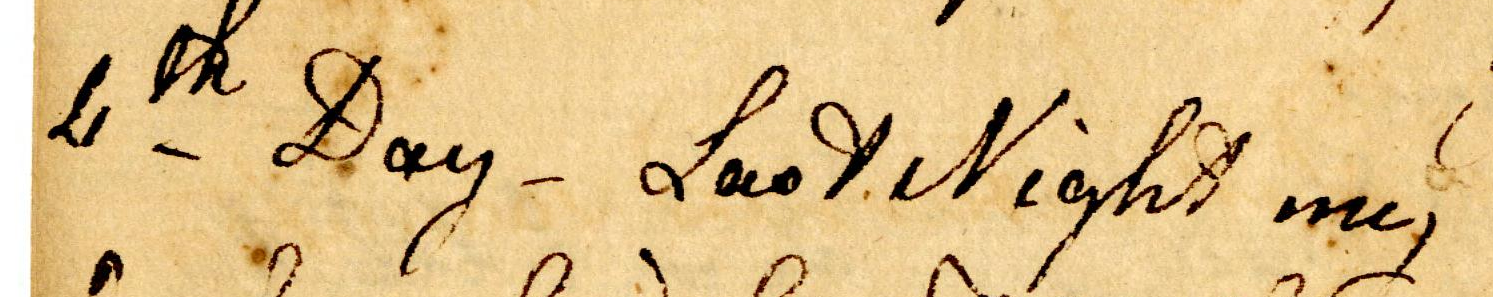4^th Day- Last Night my
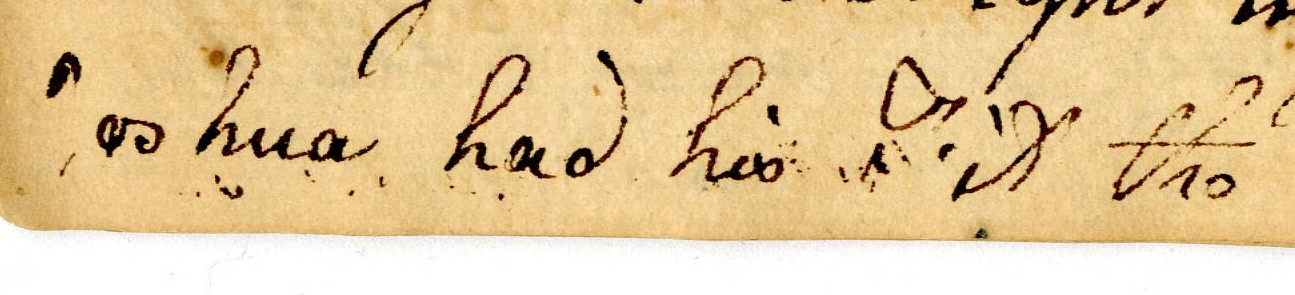Joshua had his Fitt tho
